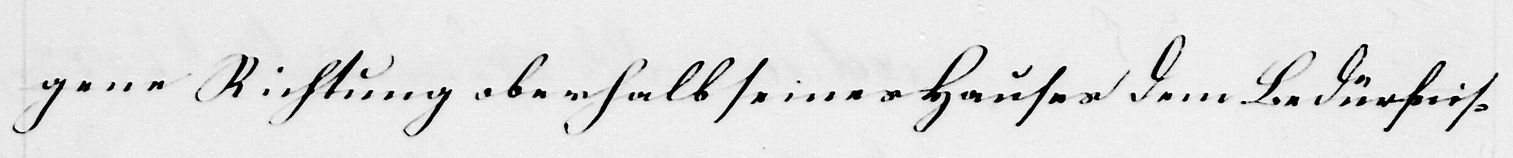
gene Richtung oberhalb seines Hauses dem Bedürfnis¬
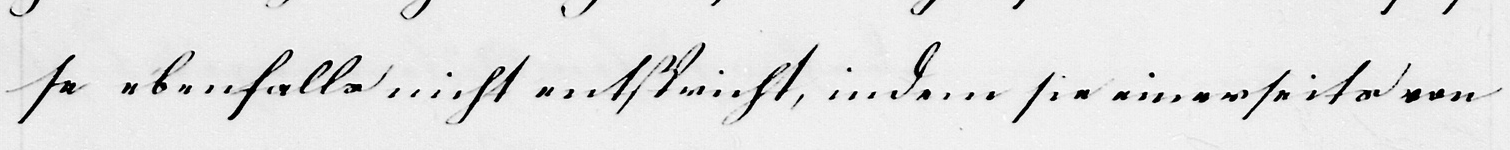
se ebenfalls nicht entspricht, indem sie einerseits von
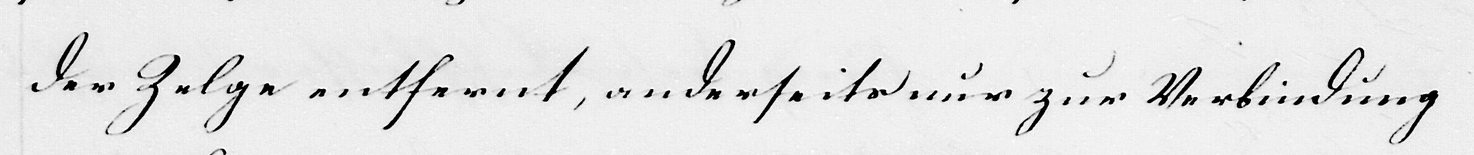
der Zelge entfernt, anderseits nur zur Verbindung
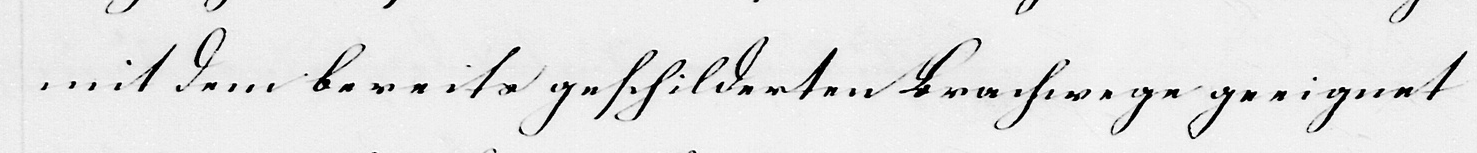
mit dem bereits geschilderten Brachwege geeignet
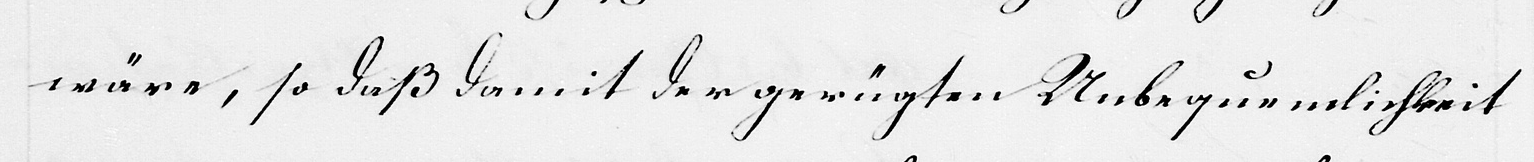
wäre, so daß damit der gerügten Unbequemlichkeit
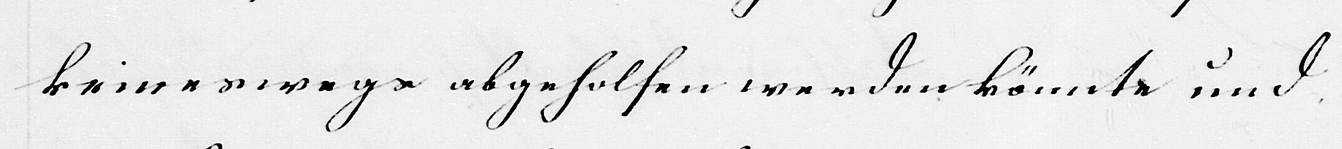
keineswegs abgeholfen werden könnte und
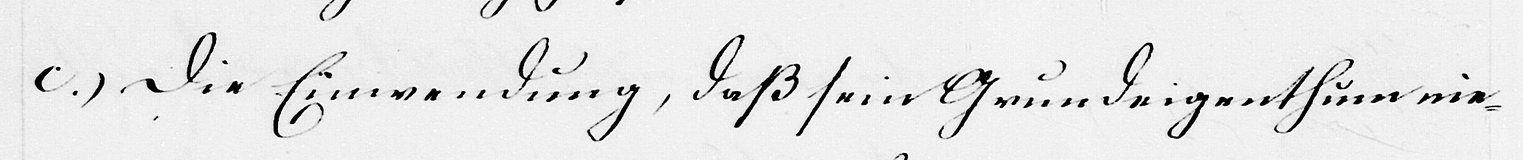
c.) Die Einwendung, daß sein Grundeigenthum nie¬
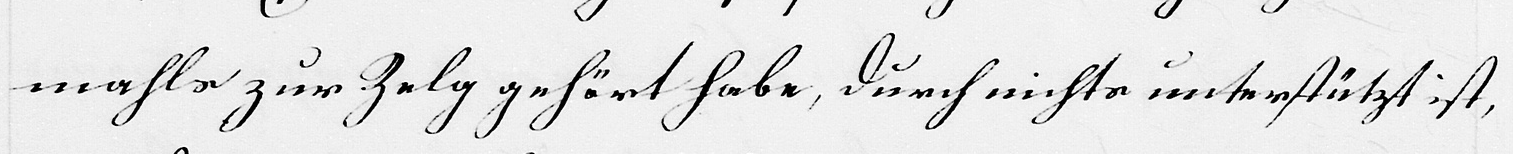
mahls zur Zelg gehört habe, durch nichts unterstützt ist,
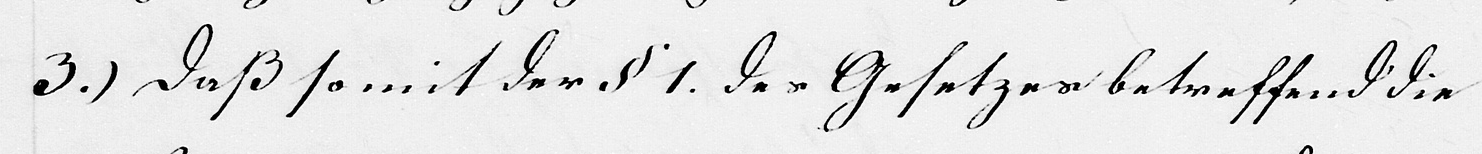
3.) Daß somit der § 1. des Gesetzes betreffend die
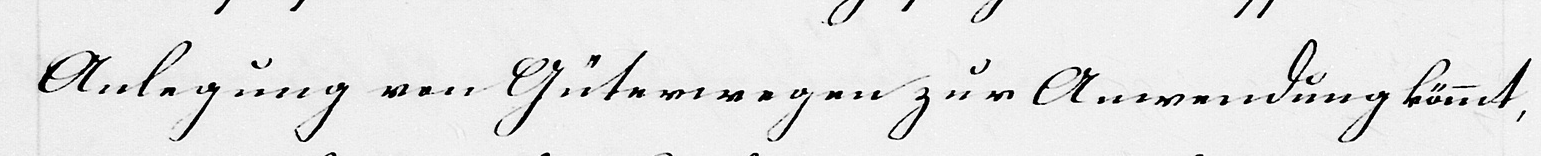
Anlegung von Güterwegen zur Anwendung kömmt,
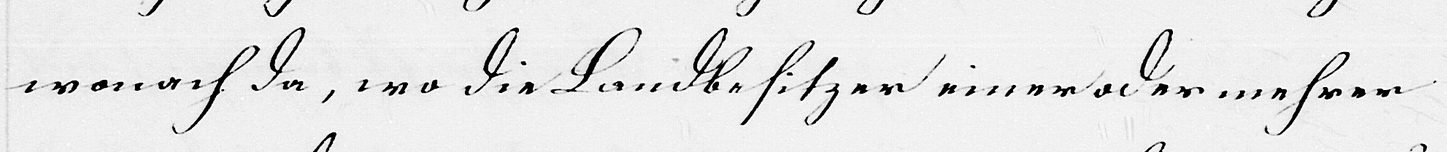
wonach da, wo die Landbesitzer einer oder mehrer
